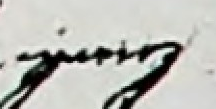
ganz
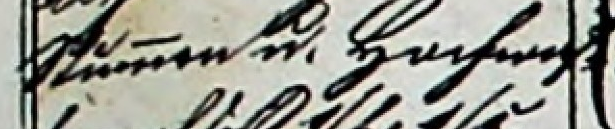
Stummen u. Hochwas„
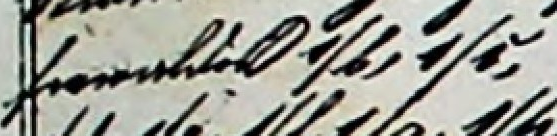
serwaldes 1/b, 1/c,
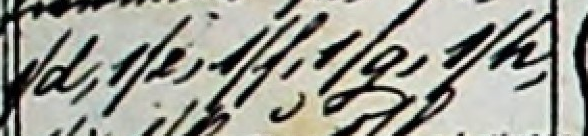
1/d, 1/e, 1/f, 1/g, 1/h,
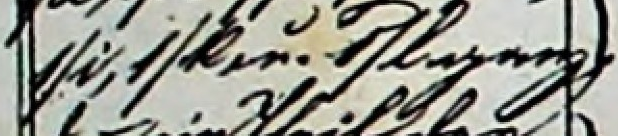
1/i, 1/k u. Pfleganz
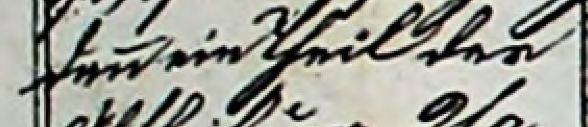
dann ein Theil der
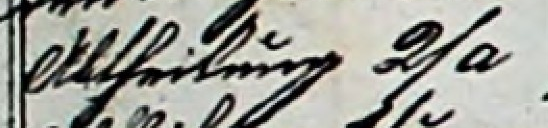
Abtheilung 2/a
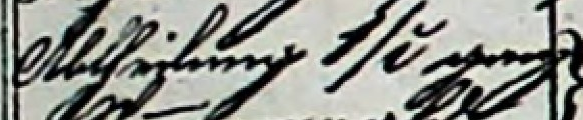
Abtheilung 1/c ganz
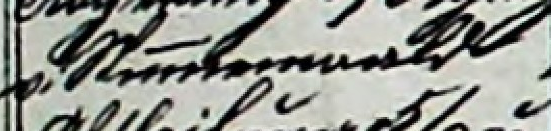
v. ???wald
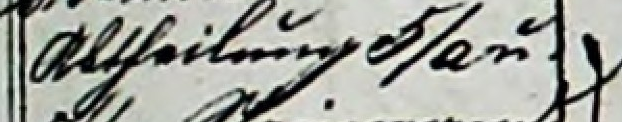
Abtheilung 5/a u.
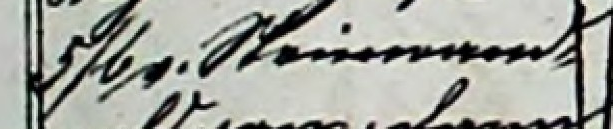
5/b v. Steierwand„
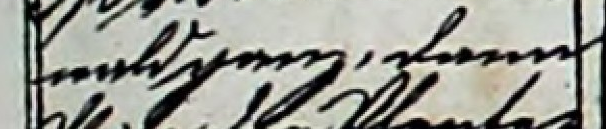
wald ganz, dann
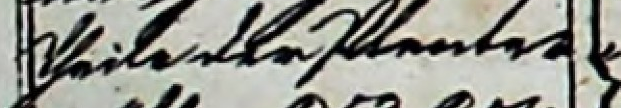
Theile der Plente?„
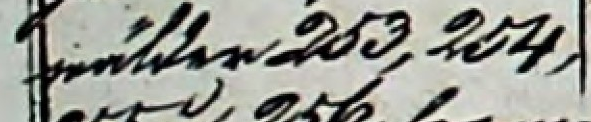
wälder 253, 254,
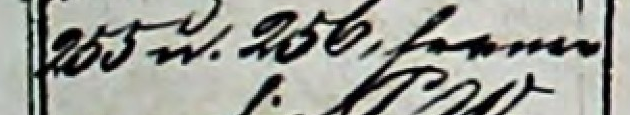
255 u. 256, ferner
